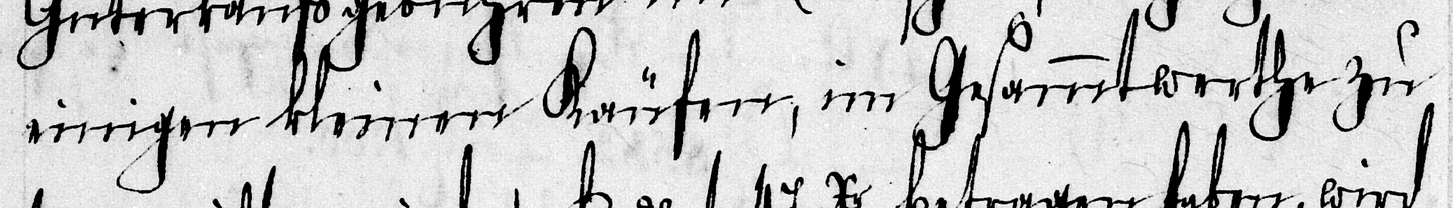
einigen kleinen Käufen, im Gesammtwerthe zu
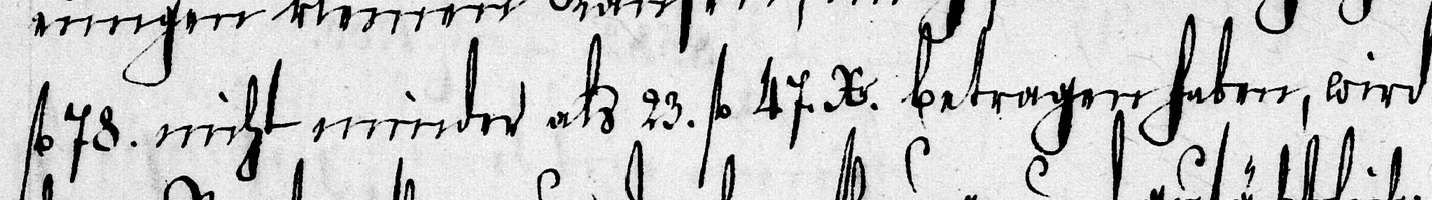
fl. 78. nicht minder als 23. fl. 47. Xr. betragen haben, wird
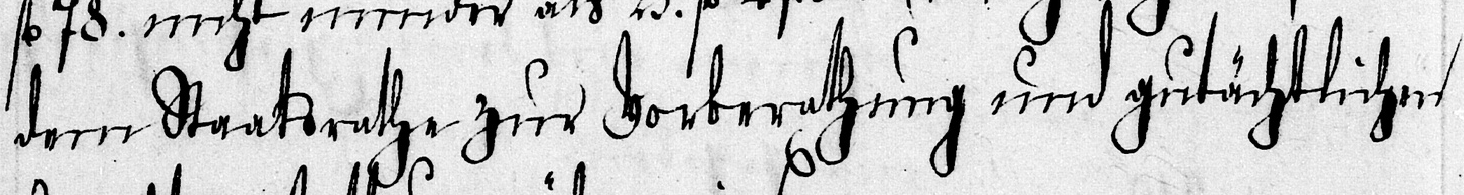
dem Staatsrathe zur Vorberathung und gutächtlichen
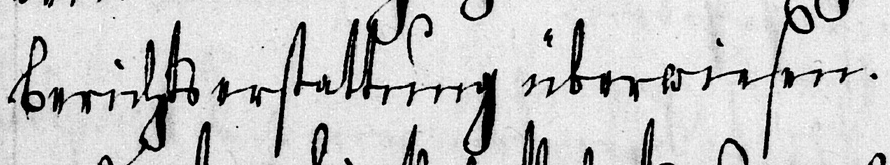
Berichtserstattung überwiesen.
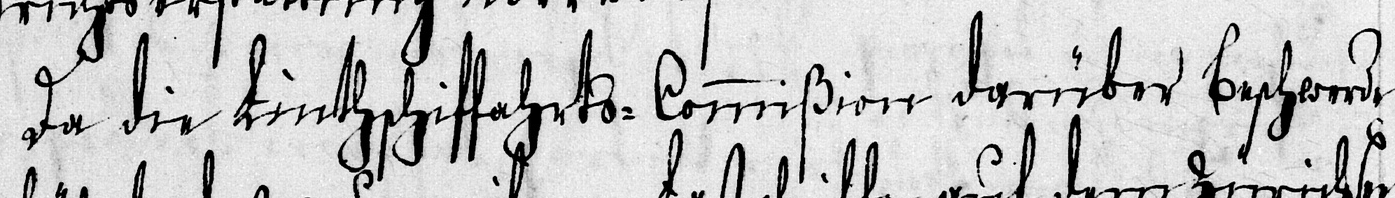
Da die Linthschiffahrts-Commißion darüber Beschwer¬
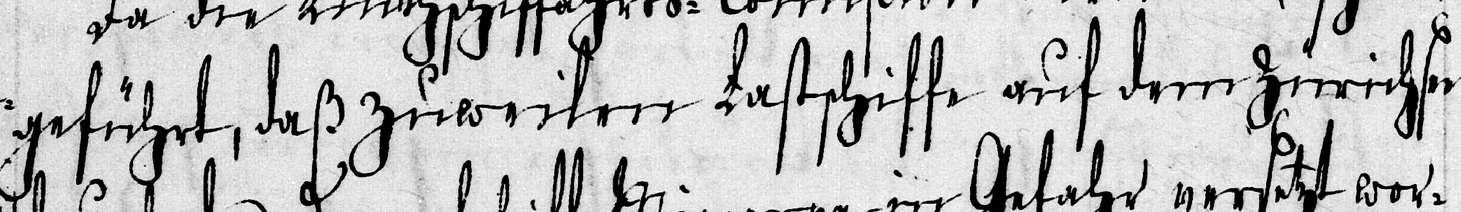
geführt, daß zuweilen Lastschiffe auf dem Zürichse¬
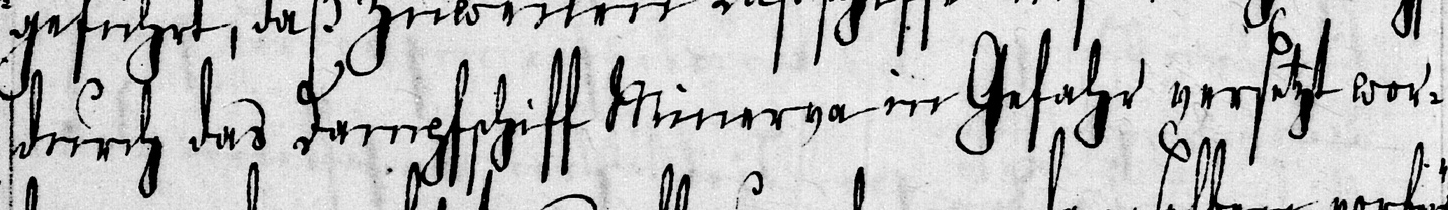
durch das Dampfschiff Minerva in Gefahr versetzt wor¬
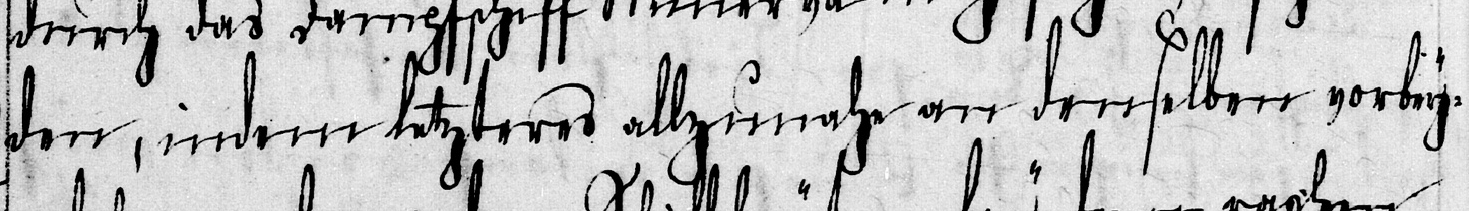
den, indem letzteres allzunahe an denselben vorbey¬
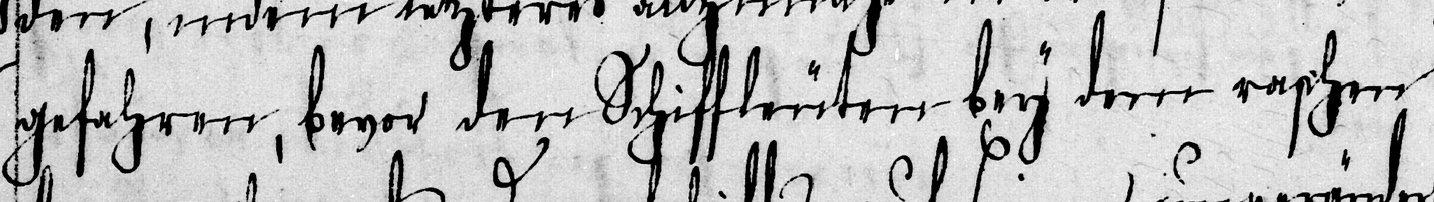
gefahren, bevor den Schiffleuten bey dem raschen
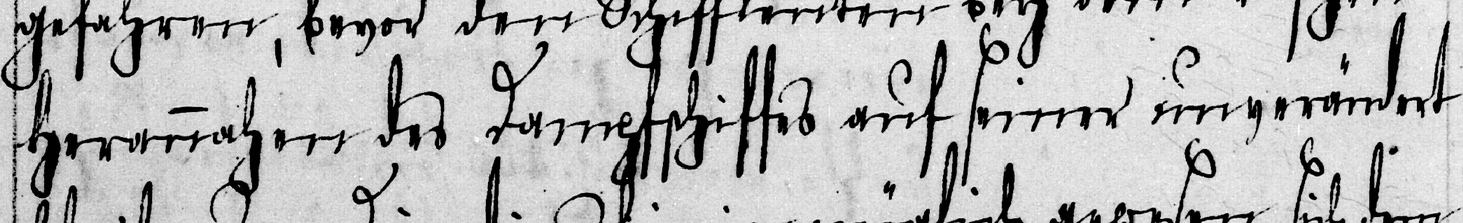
Herannahen des Dampfschiffes auf seiner unverändert
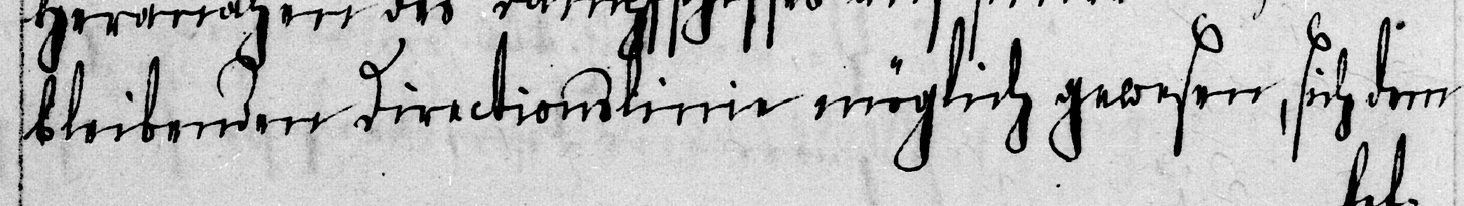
bleibenden Directionslinie möglich gewesen, sich dem
